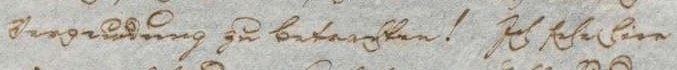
Vergeudung zu betrachen! Ich sehe hier
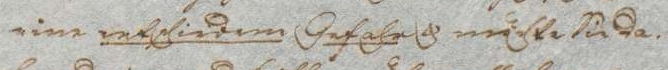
eine entschiedene Gefahr & möchte Sie da-
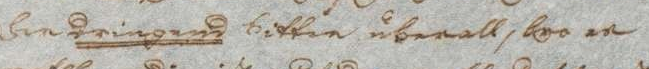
her dringend bitten überall, wo es
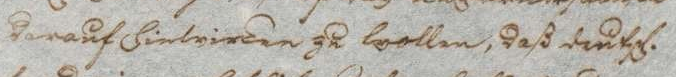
darauf hinwirken zu wollen, daß Deutsch-
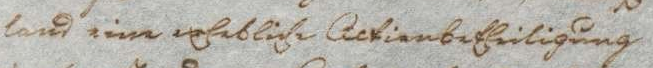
land eine erhebliche Actienbetheiligung
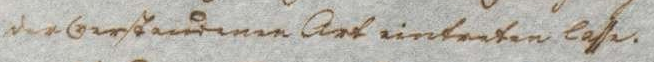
der verstandenen Art eintreten lasse.
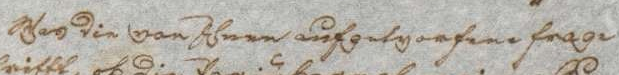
Was die von Ihnen aufgeworfene Frage
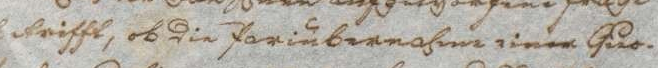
betrifft, ob die Pariübernahme einer Quo-
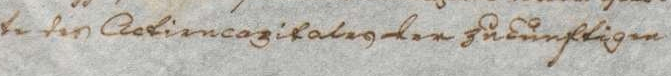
te des Actiencapitales der zukünftigen
